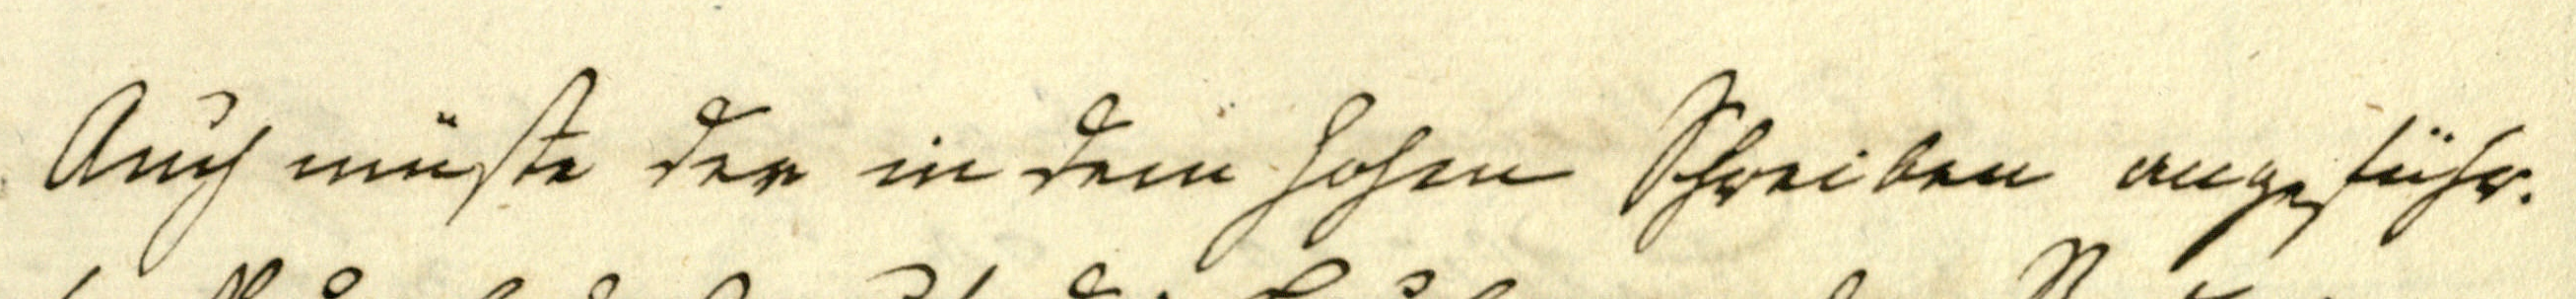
Auch müsste der in dem hohen Schreiben angeführ¬
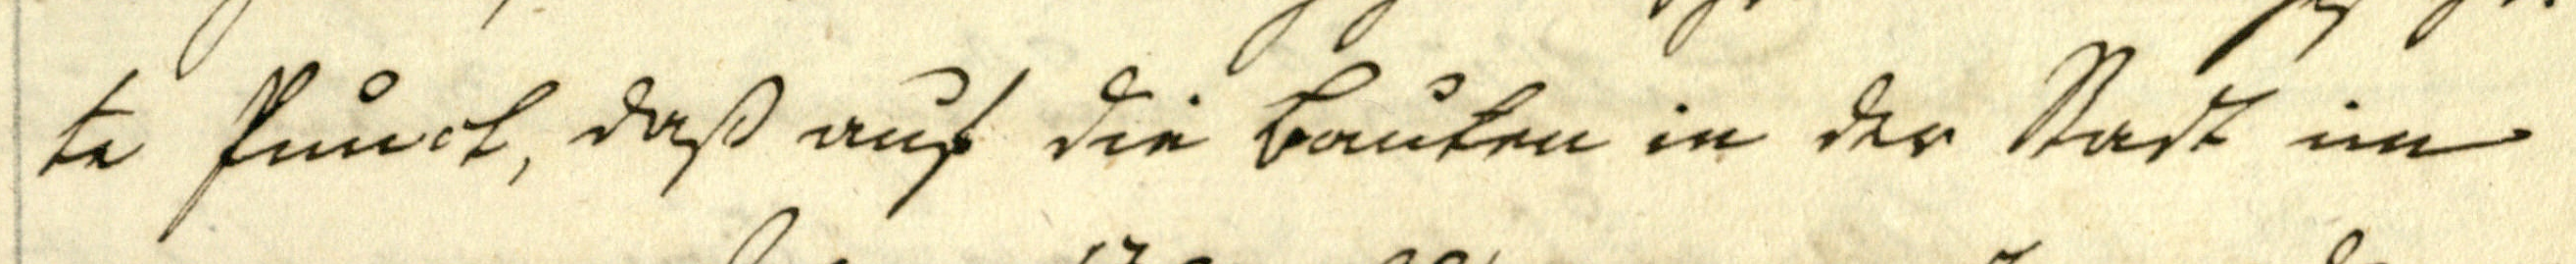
te Punct, daß auf die Bauten in der Stadt im
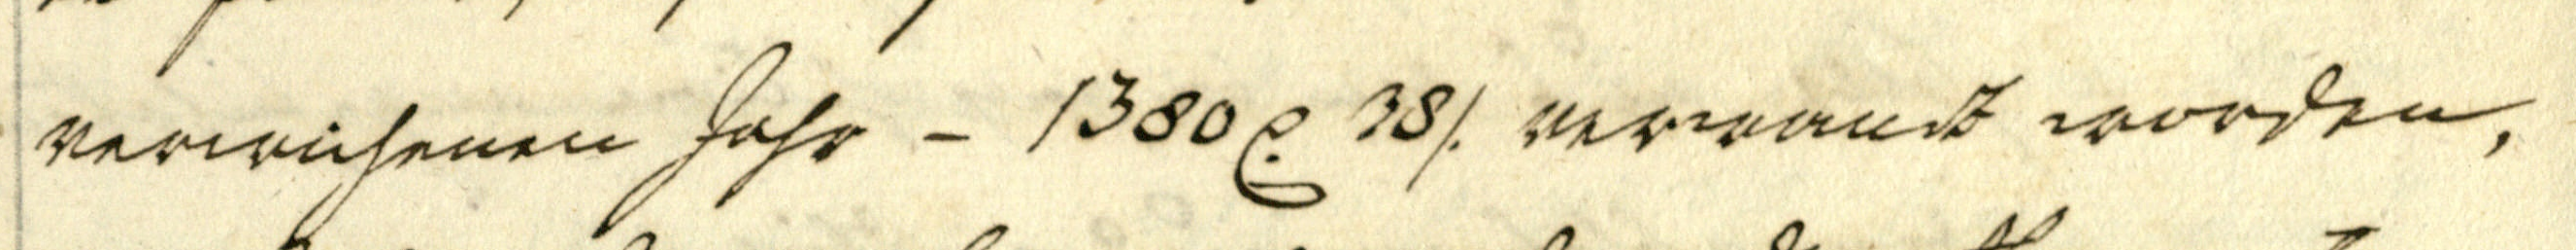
verwichenen Jahr 1380 l. 38 s. verwandt worden,
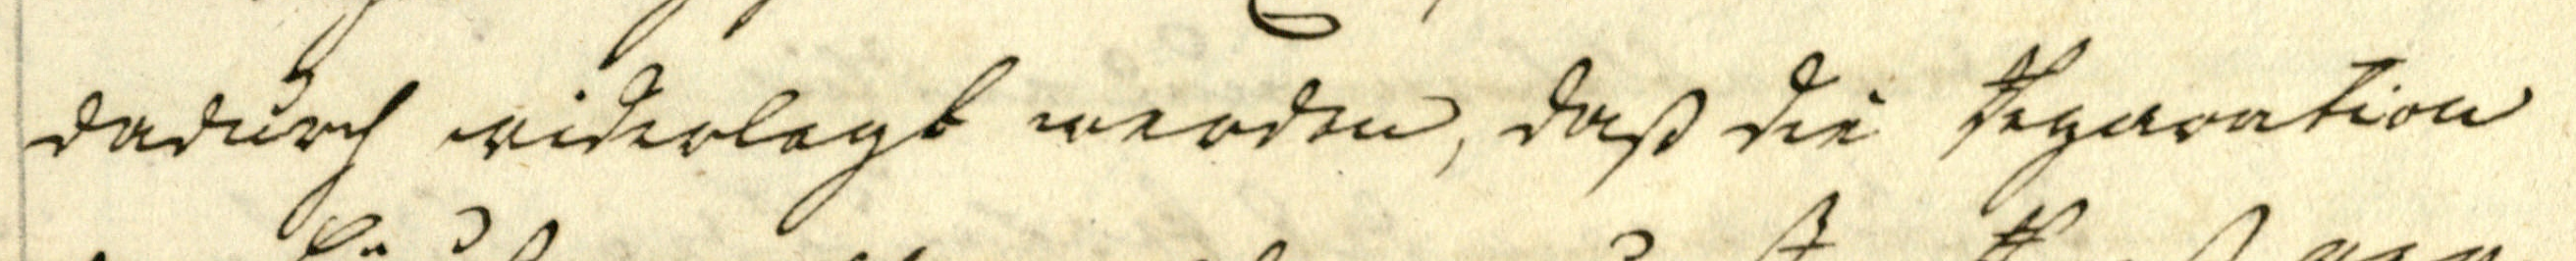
dadurch widerlegt werden, daß die Reparation
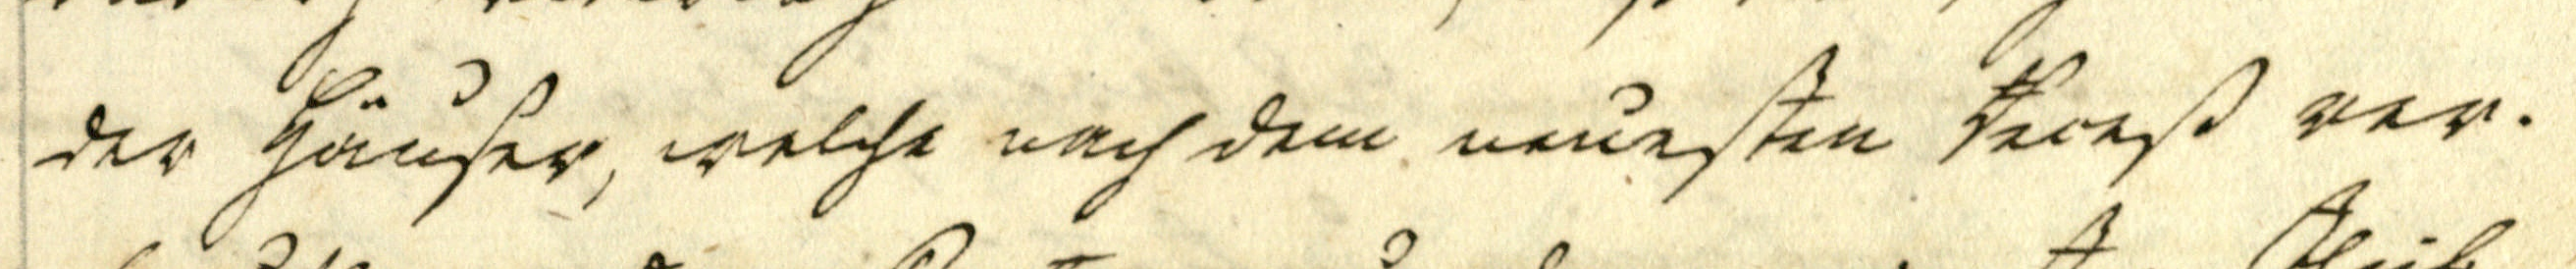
der Häuser, welche nach dem neuesten Receß ver¬
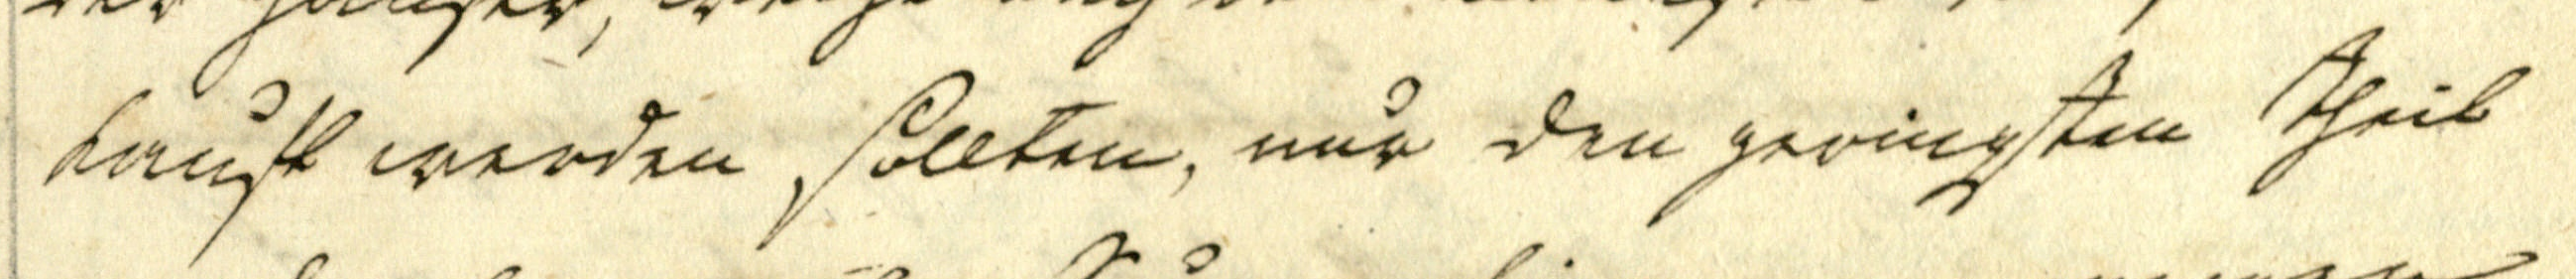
kauft werden sollten, nur den geringsten Theil
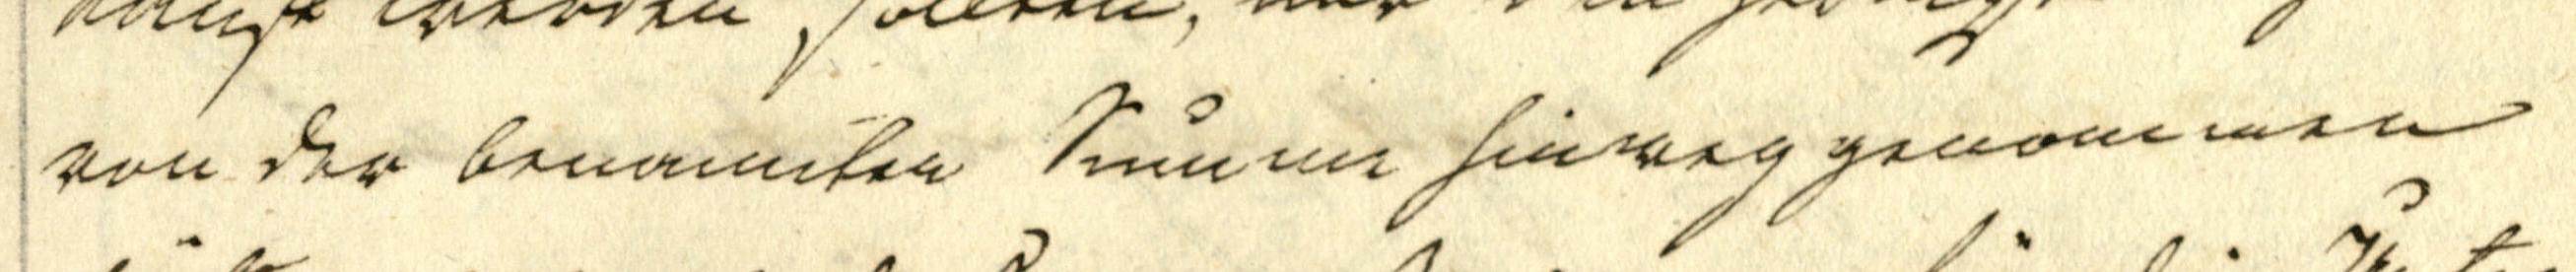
von der benannten Summe hinweg genommen
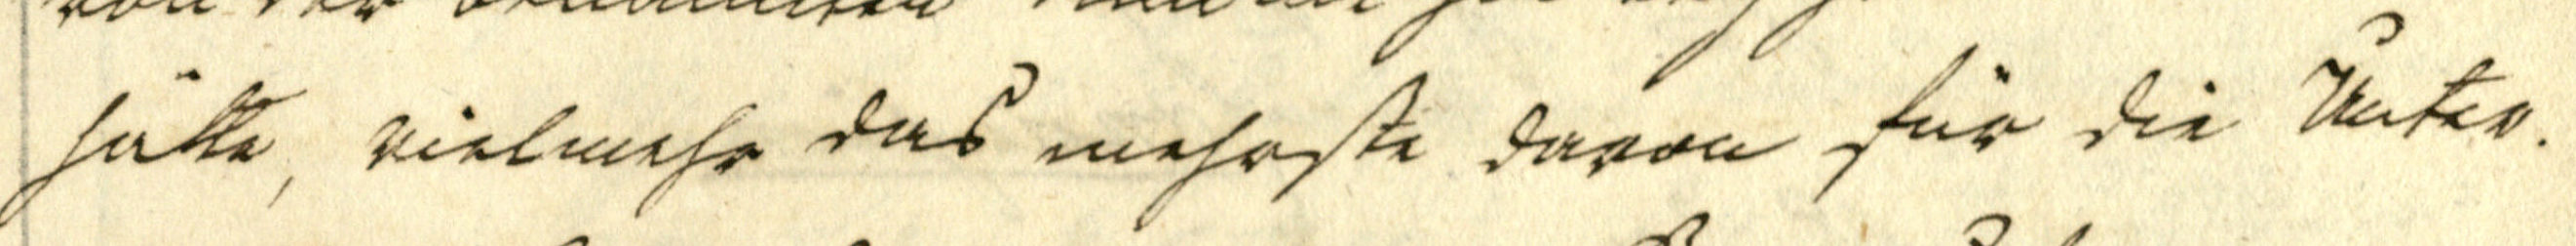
hätte, vielmehr das mehrste davon für die Unter¬
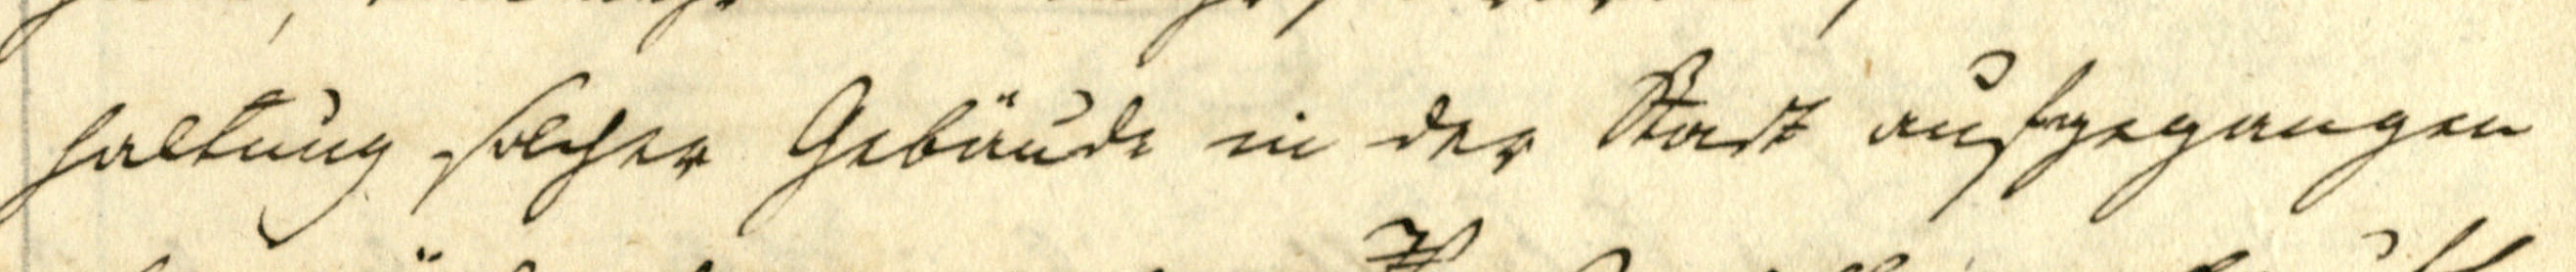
haltung solcher Gebäude in der Stadt aufgegangen
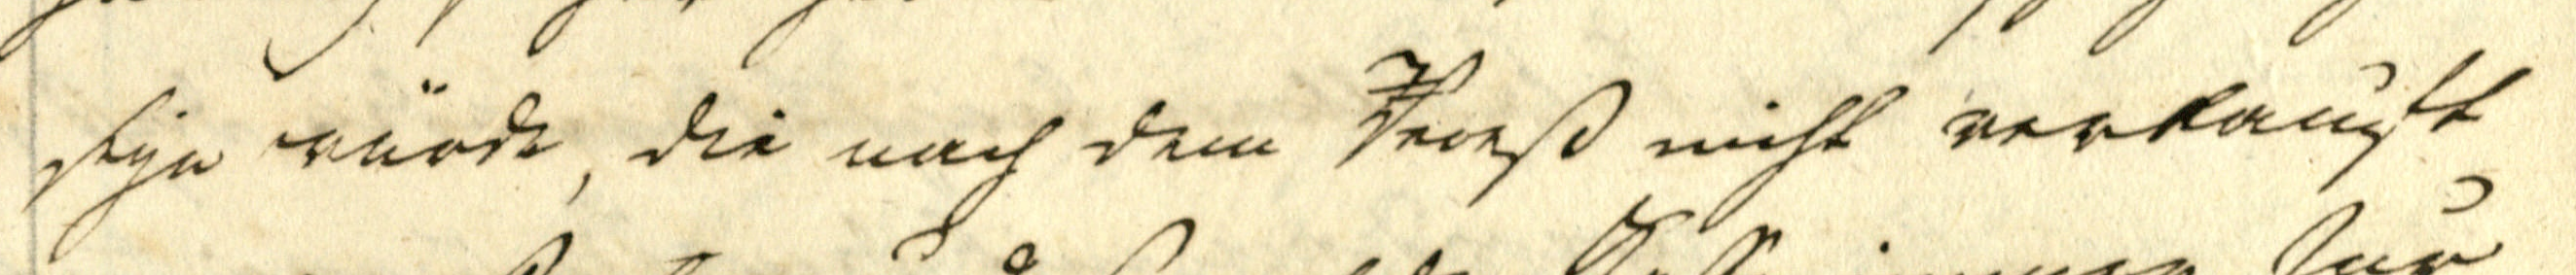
seÿn würde, die nach dem Receß nicht verkauft
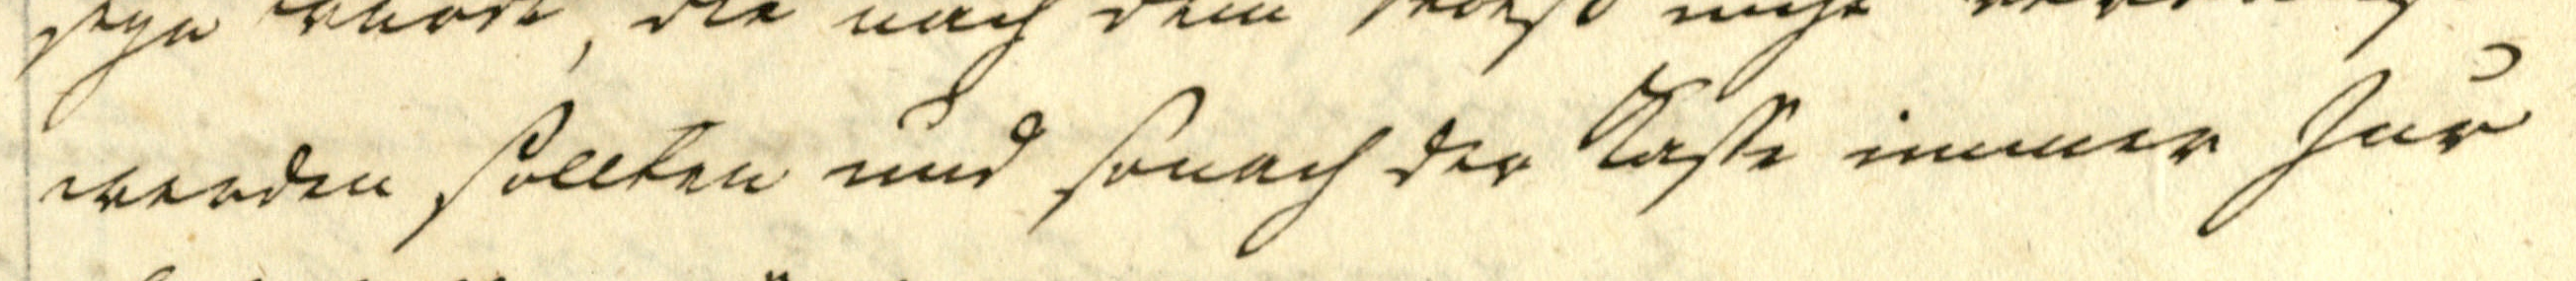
werden sollten und sonach der Kasse immer zur
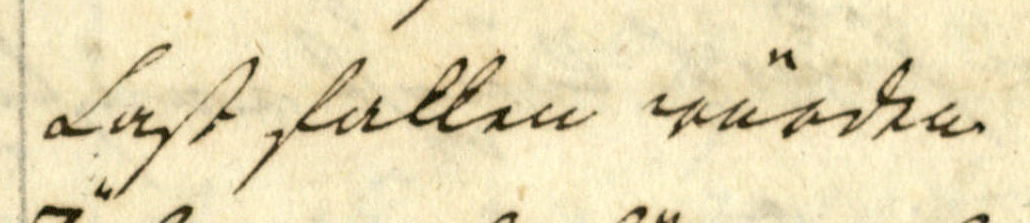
Last fallen würden.
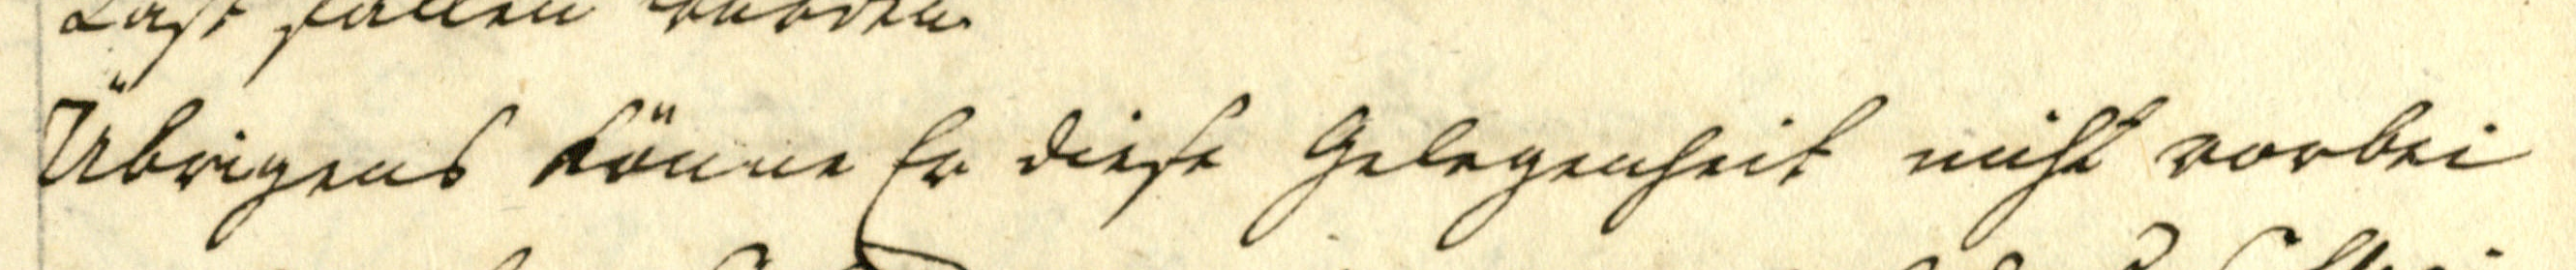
Übrigens könne Er diese Gelegenheit nicht vorbei
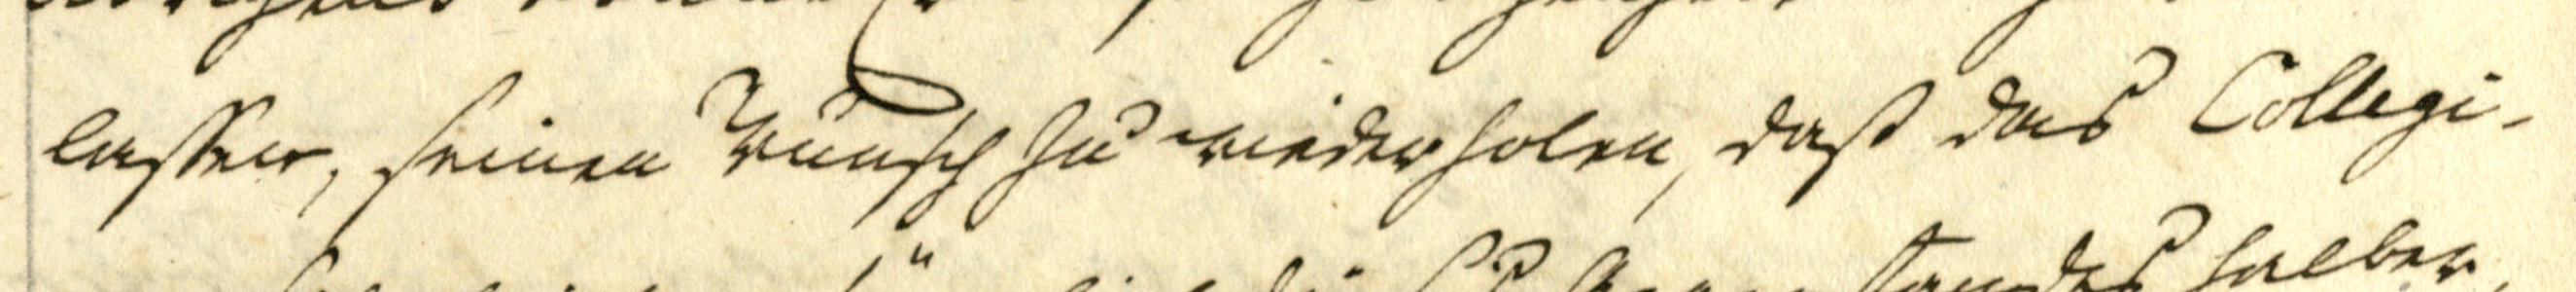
lassen, seinen Wunsch zu wiederholen, daß das Collegi¬
